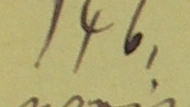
146
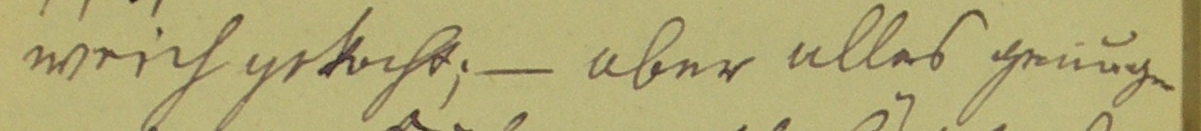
weich gekocht;- aber alles junges.
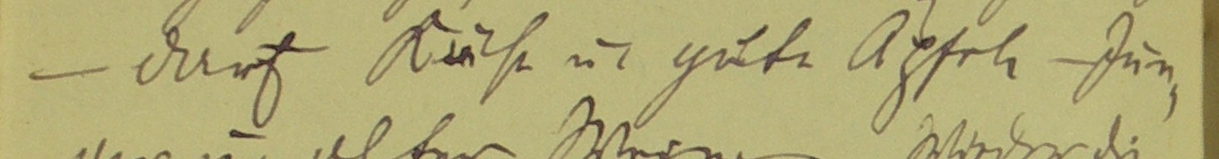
-Danach Käse und gute Äpfel- Jun¬
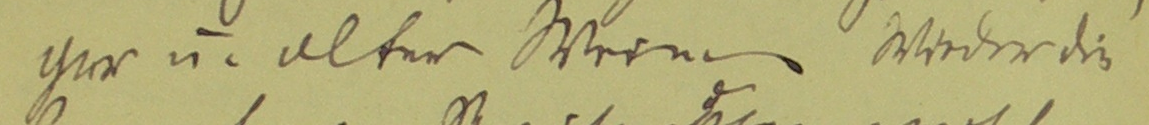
ger und alter Wein.- Wieder die
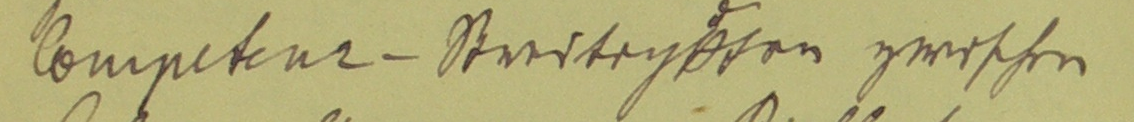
Competenz-Streitigkeiten zwischen
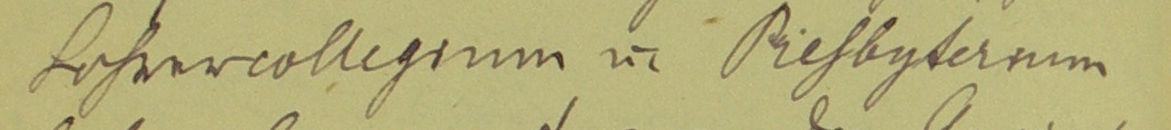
Lehrerkollegium und Presbyterium
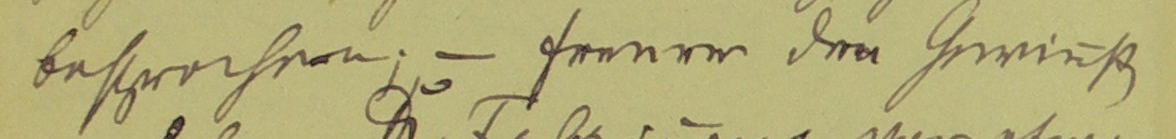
besprochen.- ferner der Gewinn
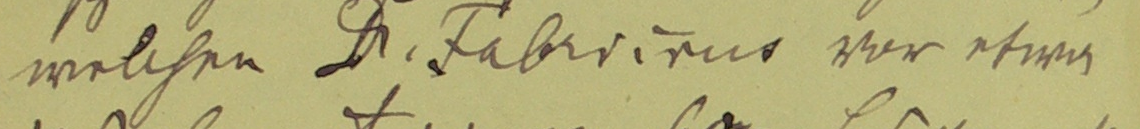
weilchen Dr. Fabricius vor etwa
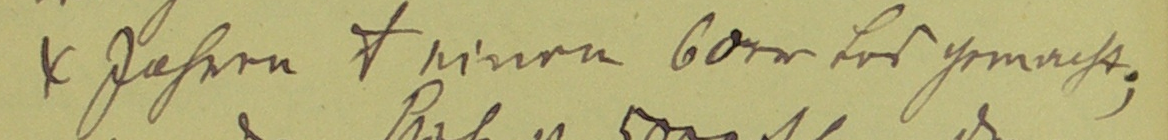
4 Jahren mit einem 60 er Los gemacht
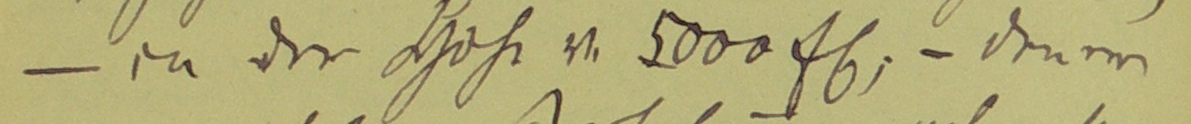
– in der Höhe von 500 Fl,- die er
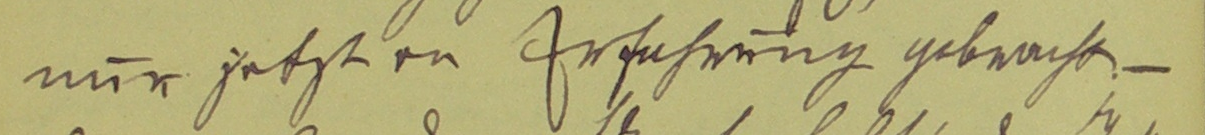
nur jetzt in Erfahrung bebracht.-
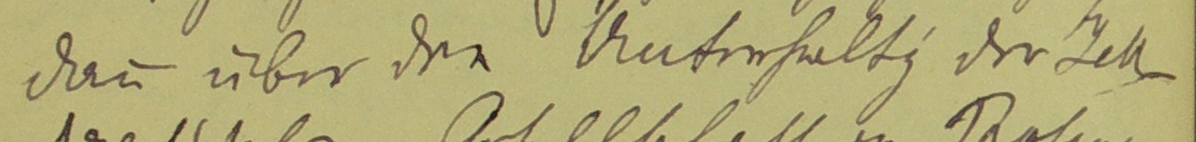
dann über die Unterhaltung der Zell
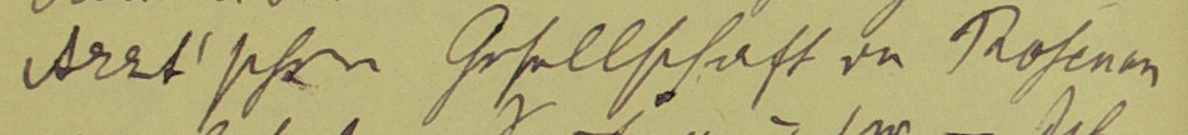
Arzt-schen Gesellschaft in Rosenau
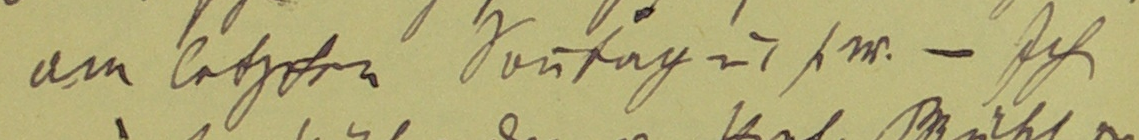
am letzten Sonntag u.s.w.- Ich
